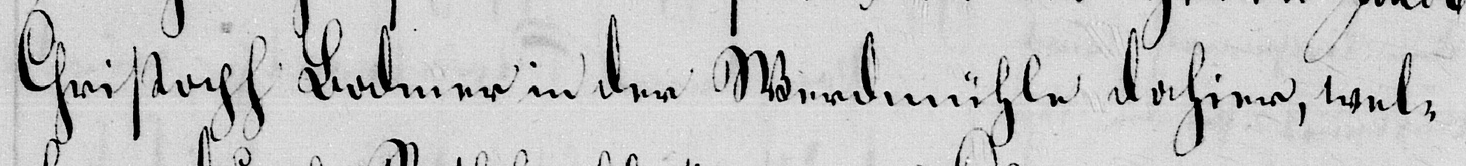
Christopf Bodmer in der Werdmühle dahier, wel¬
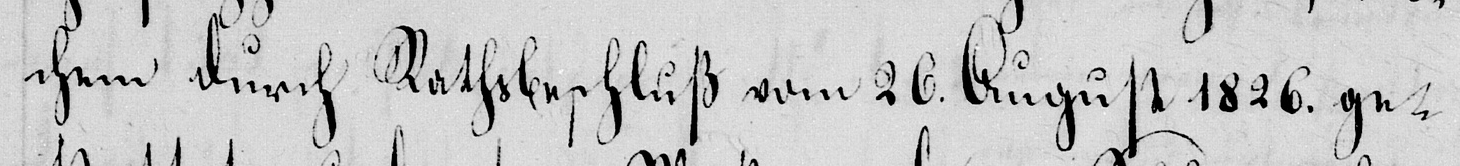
chem durch Rathsbeschluß vom 26. August 1826. ge¬
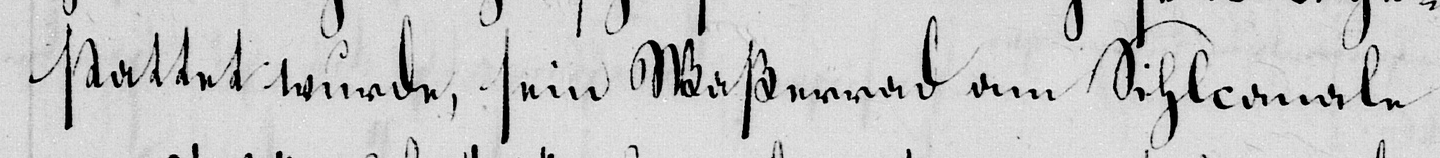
stattet wurde, sein Waßerrad am Sihlcanal
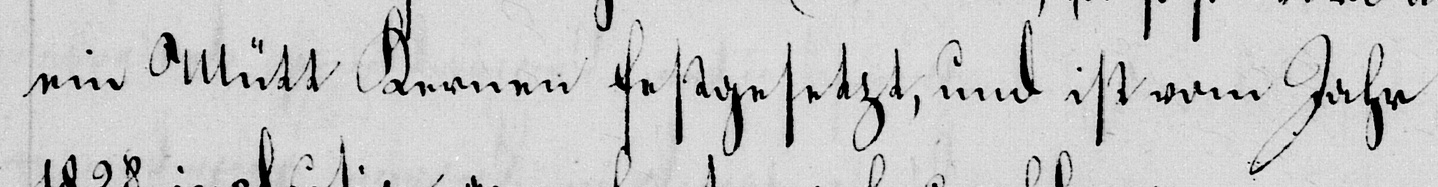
ein Mütt Kernen festgesetzt, und ist vom Jahr
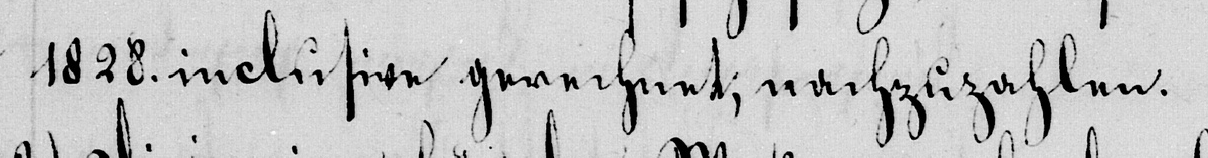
1828. inclusive gerechnet, nachzuzahlen.
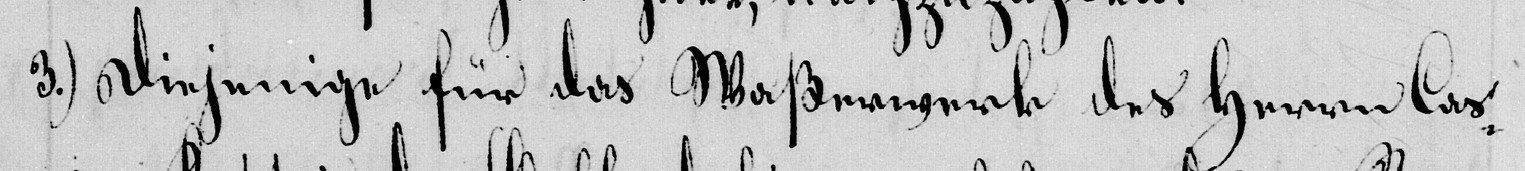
3.) Diejenige für das Waßerwerk des Herrn Cap¬
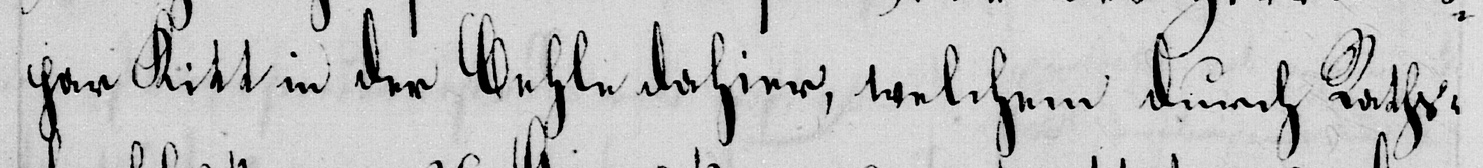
sar Ritt in der Oehle dahier, welchem durch Raths¬
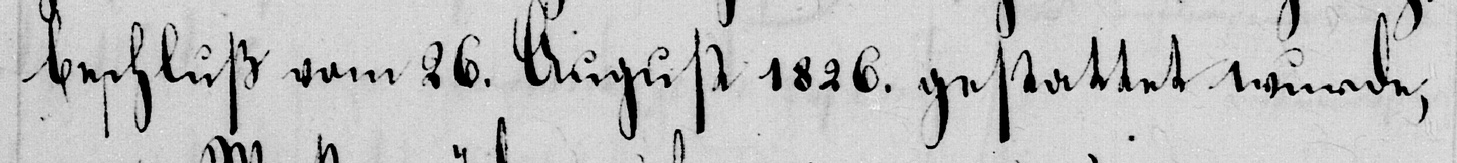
beschluß vom 26. August 1826. gestattet wurde,
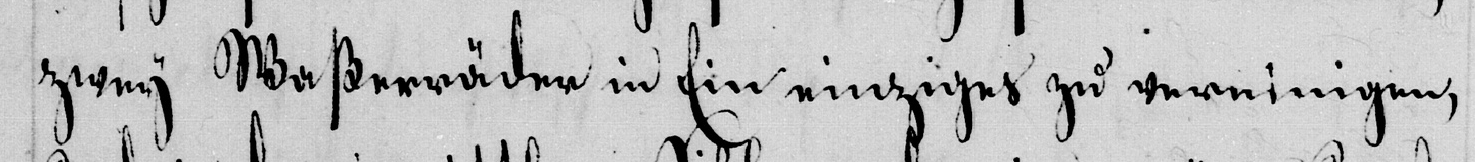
zwey Waßerräder in Ein einziges zu vereinigen,
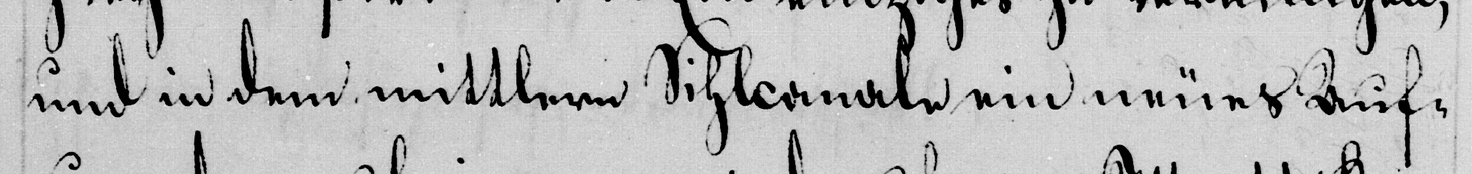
und in dem mittlern Sihlcanale ein neues Auf¬
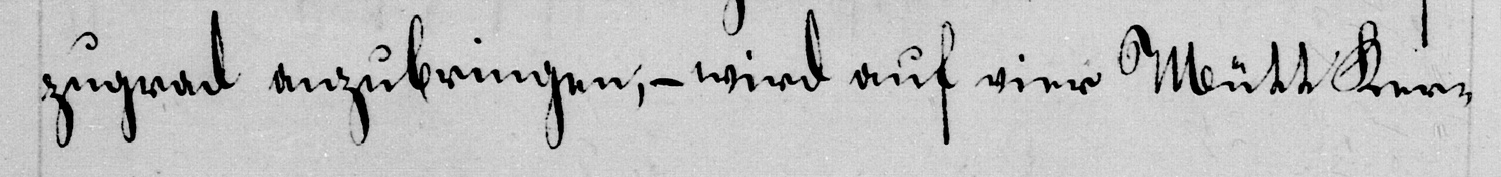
zugrad anzubringen, – wird auf vier Mütt Ker-
